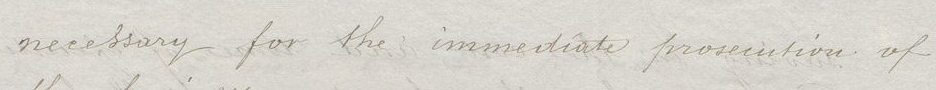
necessary for the immediate prosecution of
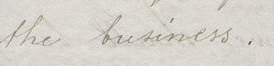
the business.
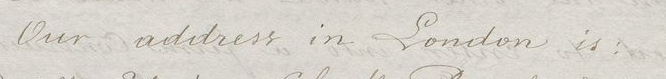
Our address in London is:
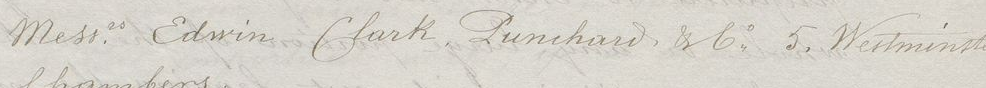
Messss Edwin Clark Punchard & Co 5. Westminster
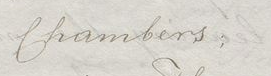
Chambers;
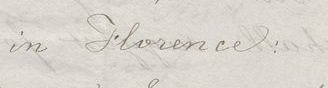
in Florence:
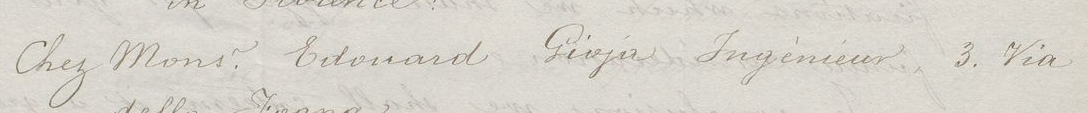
Chez Monsr Edouard Gioja Ingénieur, 3. Via
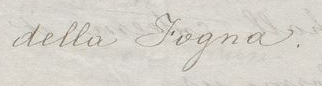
della Fogna.
